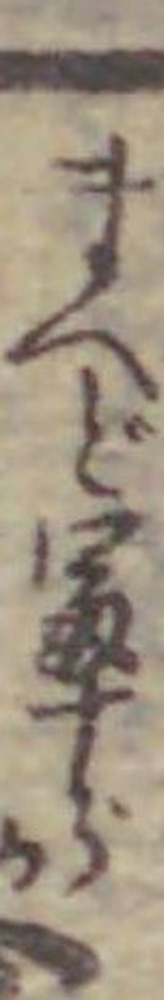まへど富十郎か
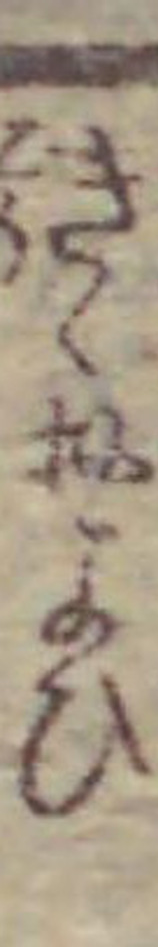きゝおよひ
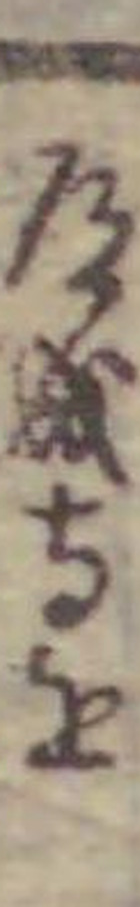道成寺を

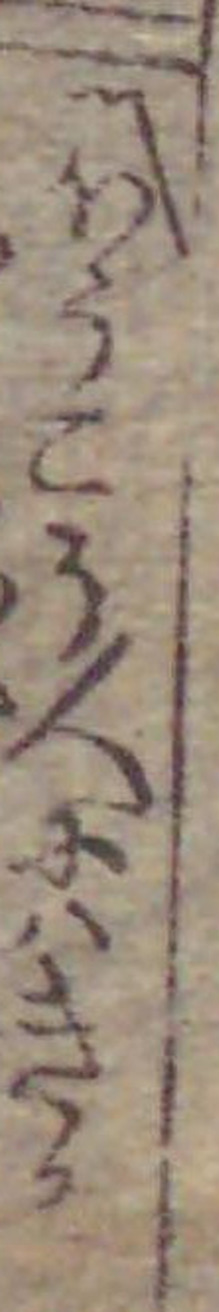〽ほうこう人にはきか
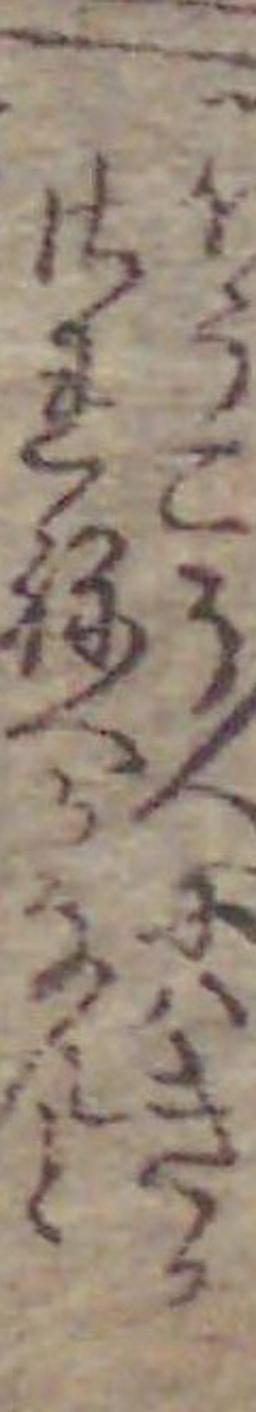されねへかなんと
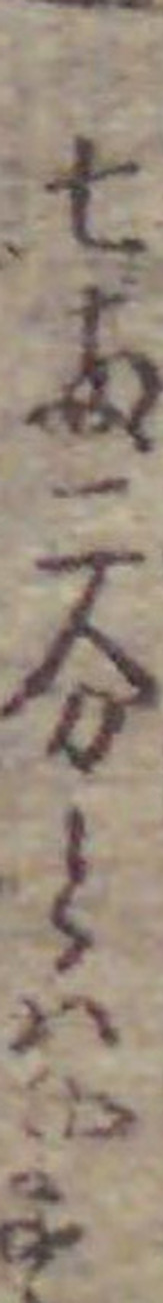七両二分とはやすい
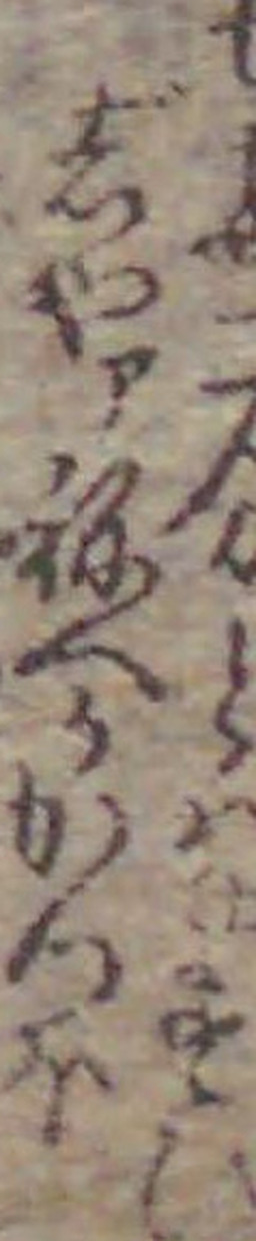ぢやァねへかかつほ
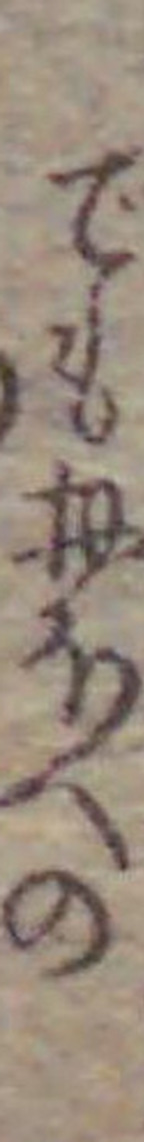でもおほへの
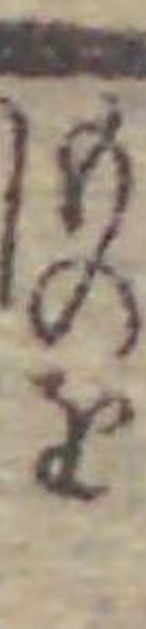ものを
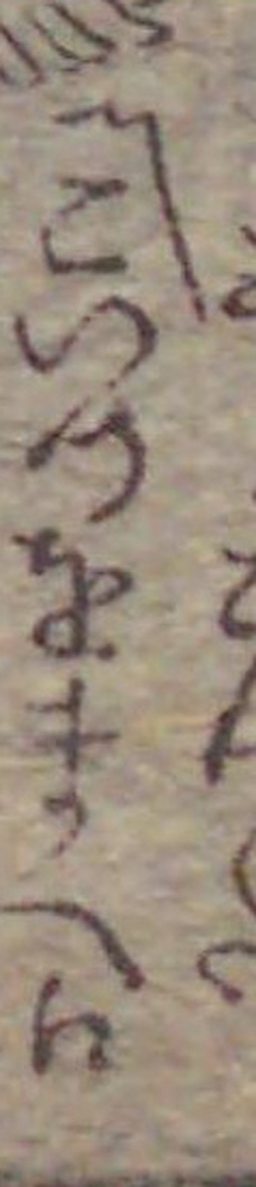〽こいつをまへえ
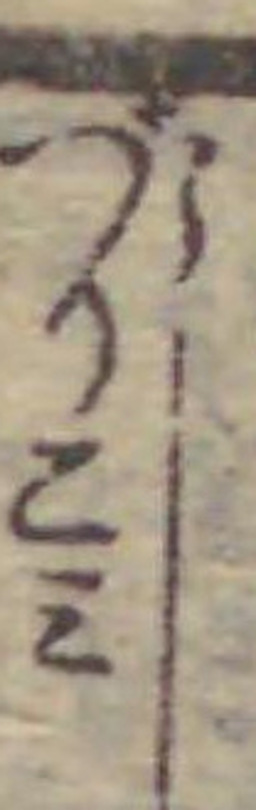づりこみ
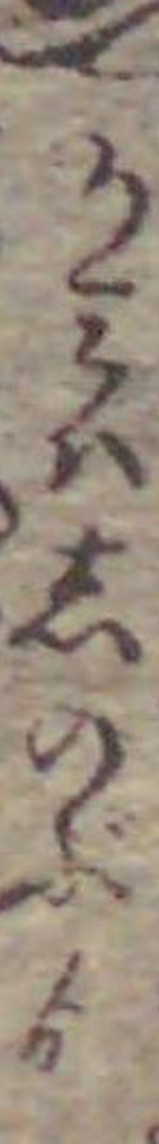かみはしのぶより
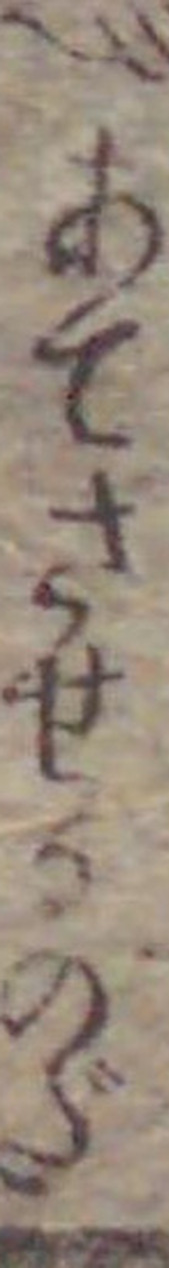あてさせるのだ
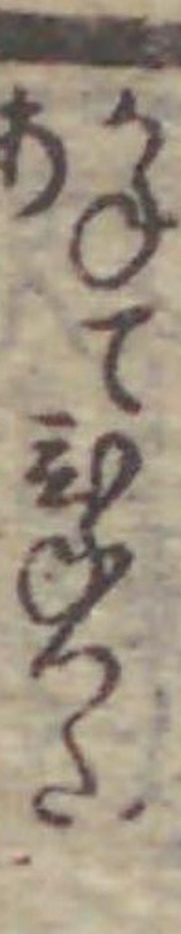かねてひねつた
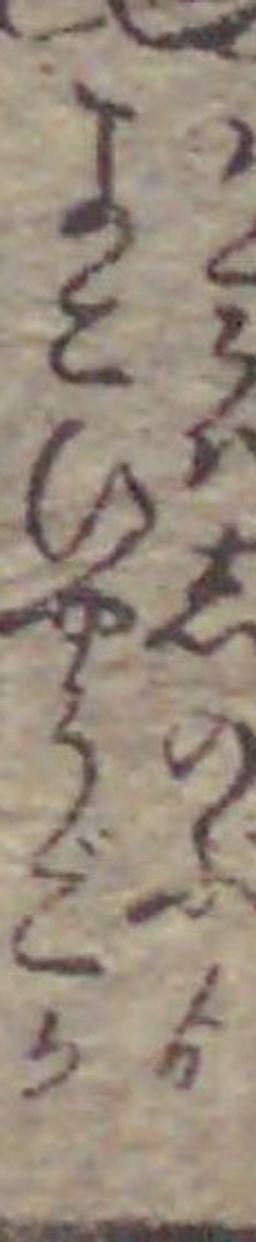よこひやうごか
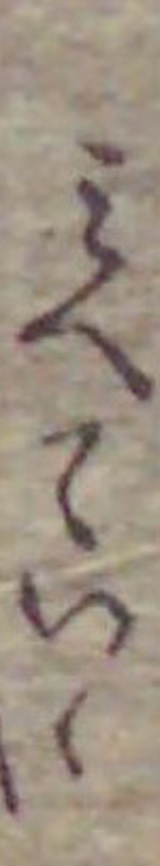みへていゝ
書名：箱入娘面屋人魚 3巻
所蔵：国立国会図書館 National Diet Library, JAPAN
